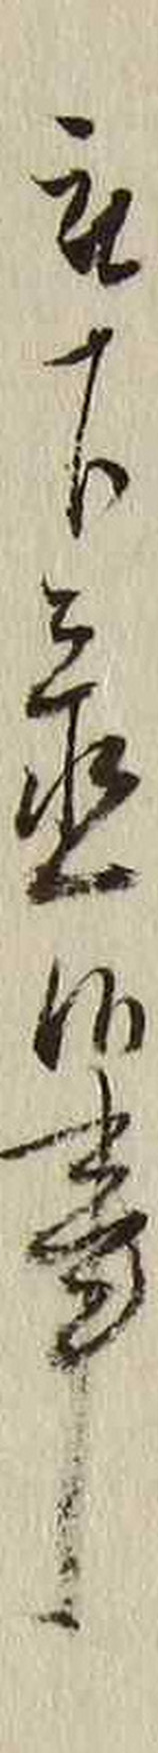被下置候事
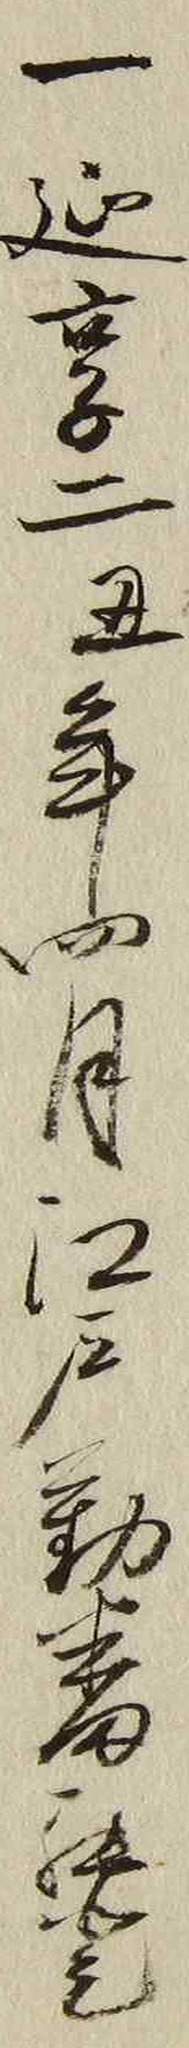一延享二丑年四月江戸勤番罷登
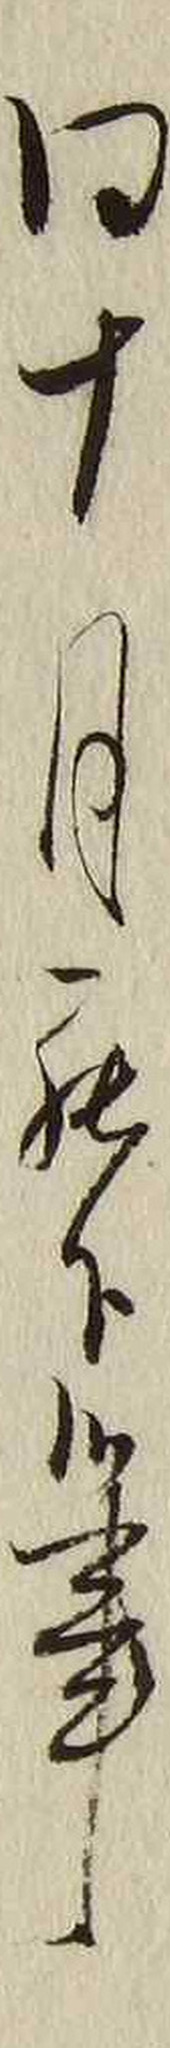同十月罷下候事
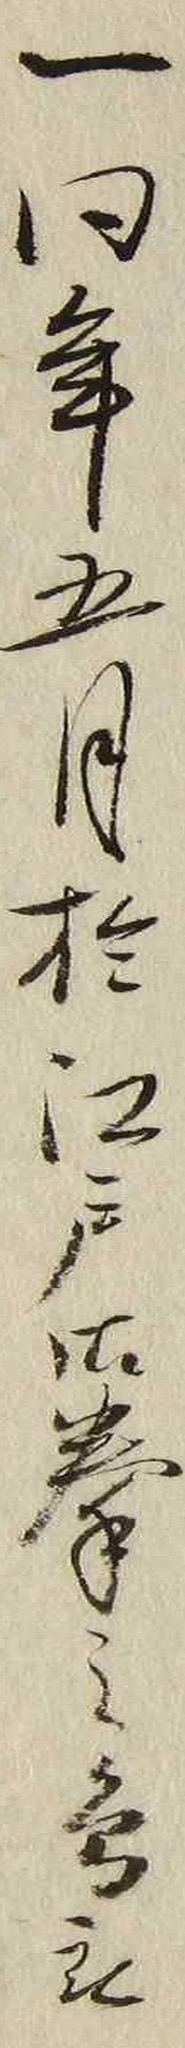一同年五月於江戸御拳之鳥被
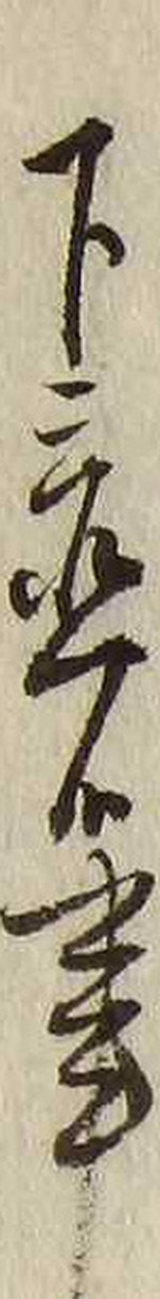下置候事

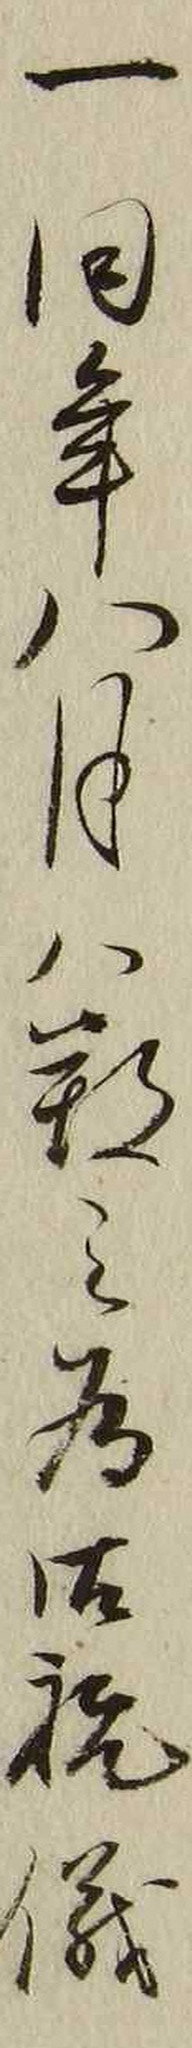一同年八月八朔之為御祝儀
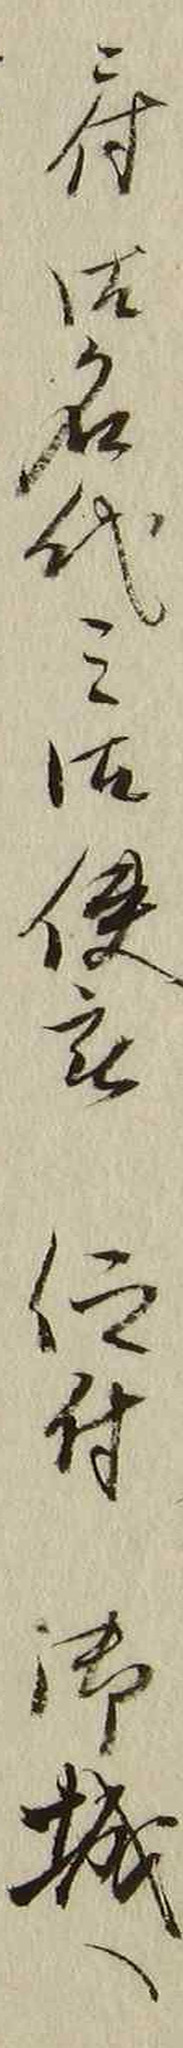ニ付御名代之御使被仰付御城へ
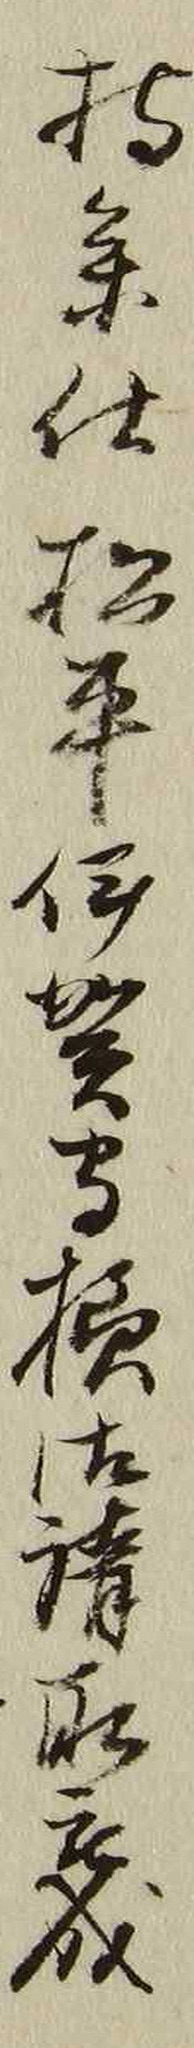持参仕松平伊賀守様御請取被成
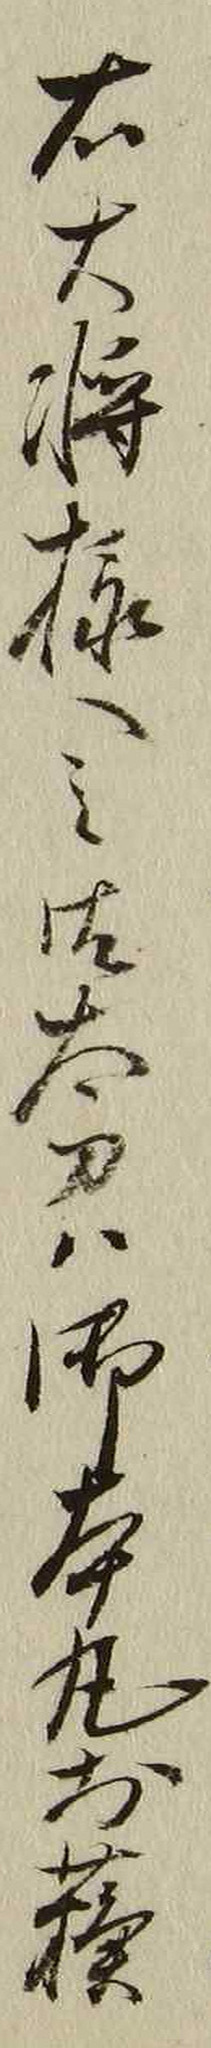右大将様へ之御太刀ハ御本丸於蘇
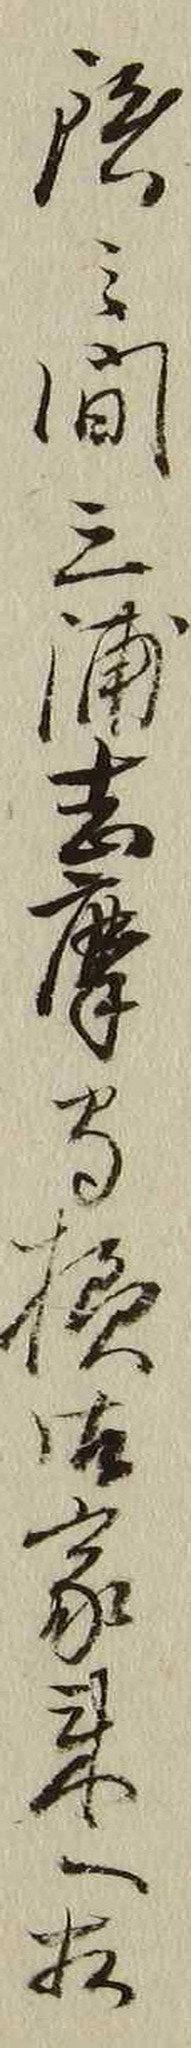鉄之間三浦志摩守様御家来へ相
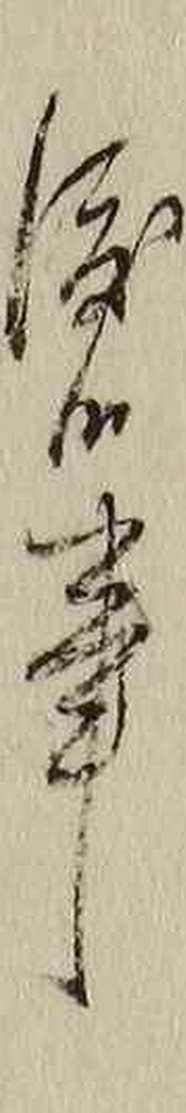渡候事
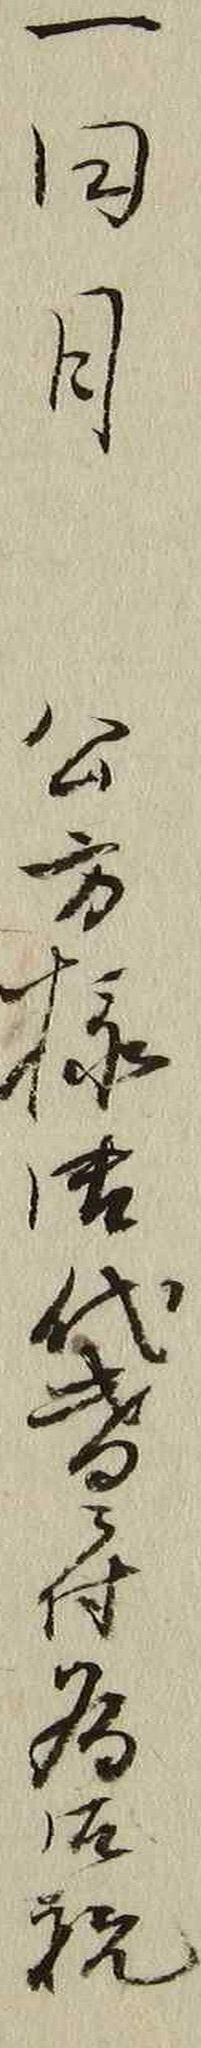一同月公方様御代替ニ付為御祝
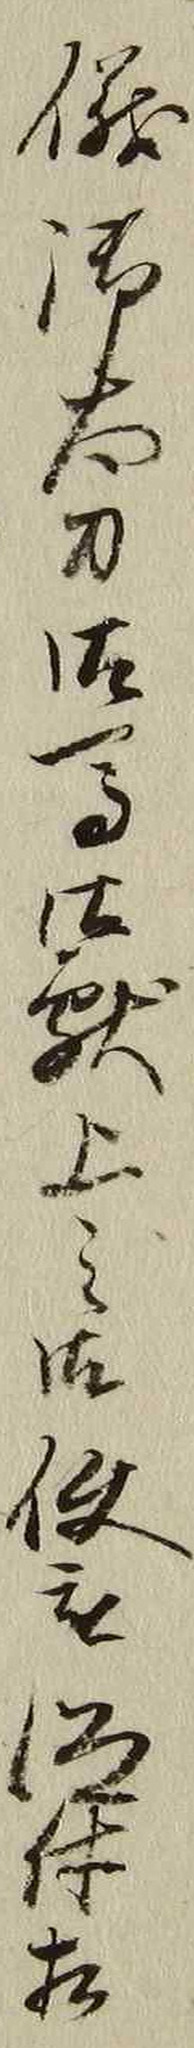儀御太刀御馬御献上之御使被仰付相
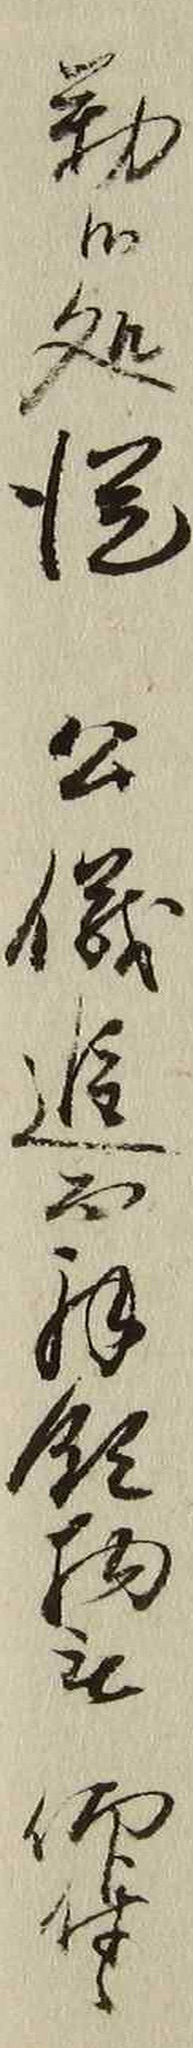勤候処従公儀追而拝領物被仰付候
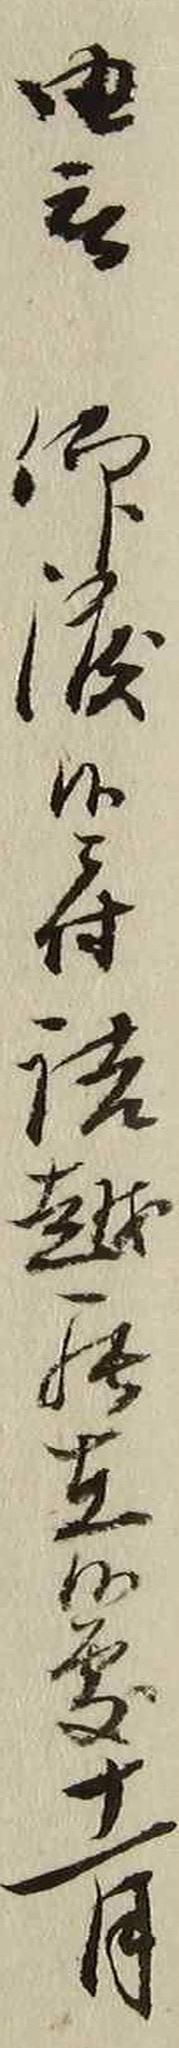由被仰渡候ニ付詰越罷在候処十一月
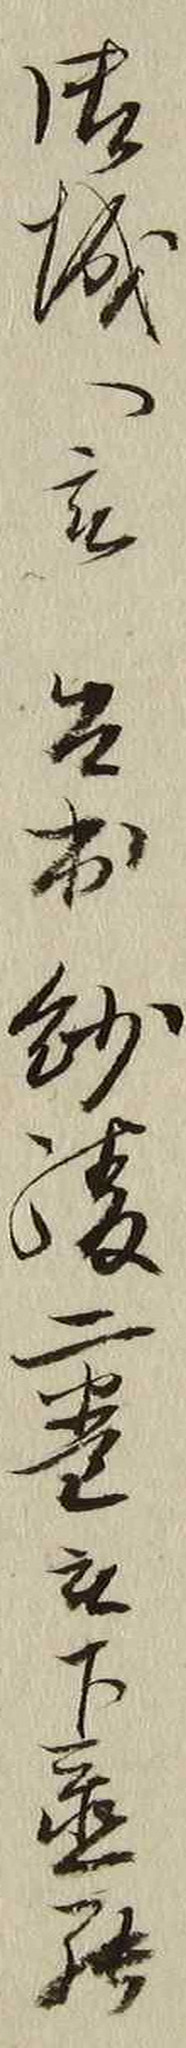御城へ被召出紗綾二巻被下置罷
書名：諸士系譜　巻之351　す之部1
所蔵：会津若松市立会津図書館
